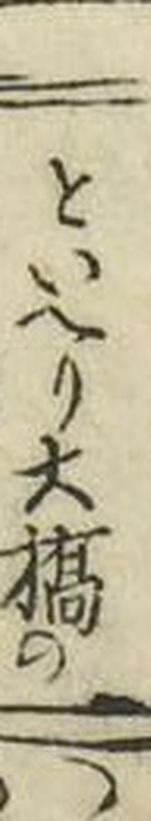といへり大橋の
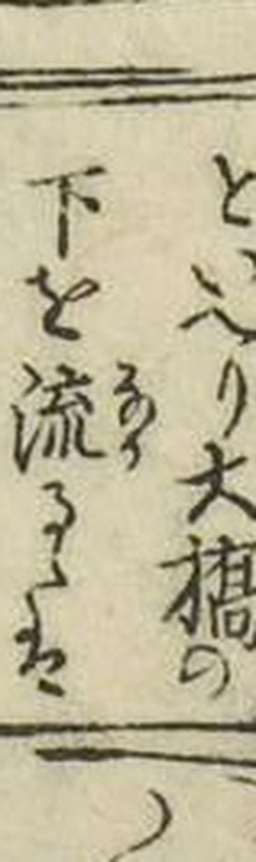下を流るゝは
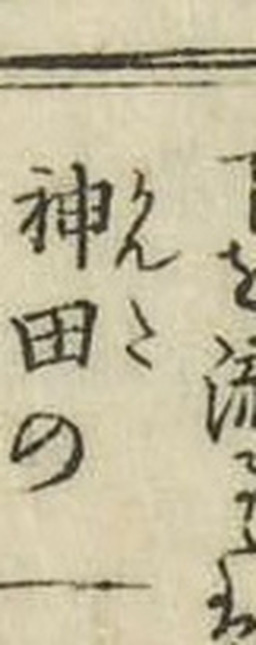神田の

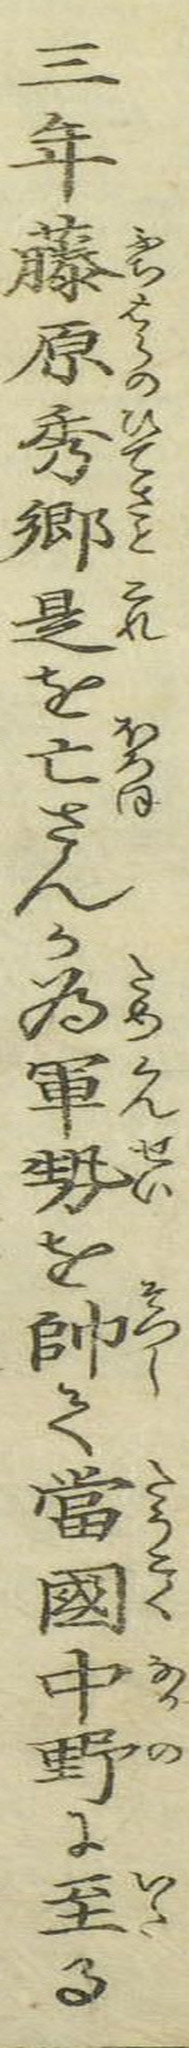三年藤原秀郷是を亡さんか為軍勢を帥て当国中野に至る
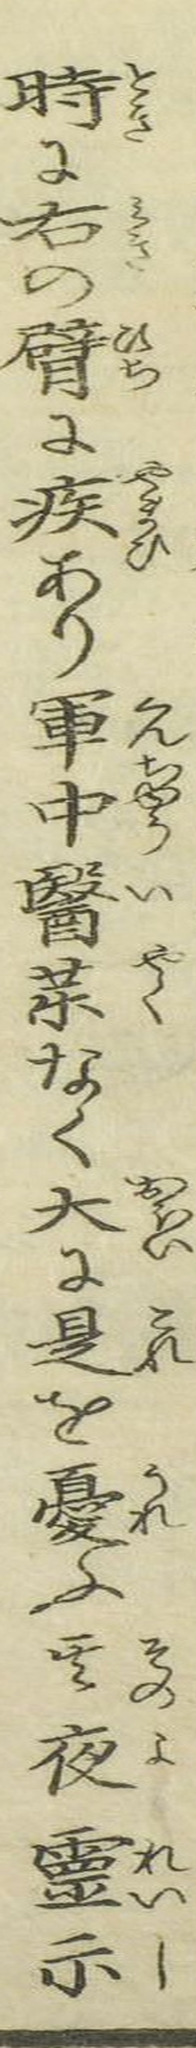時に右の臂に疾あり軍中医薬なく大に是を憂ふ其夜霊示
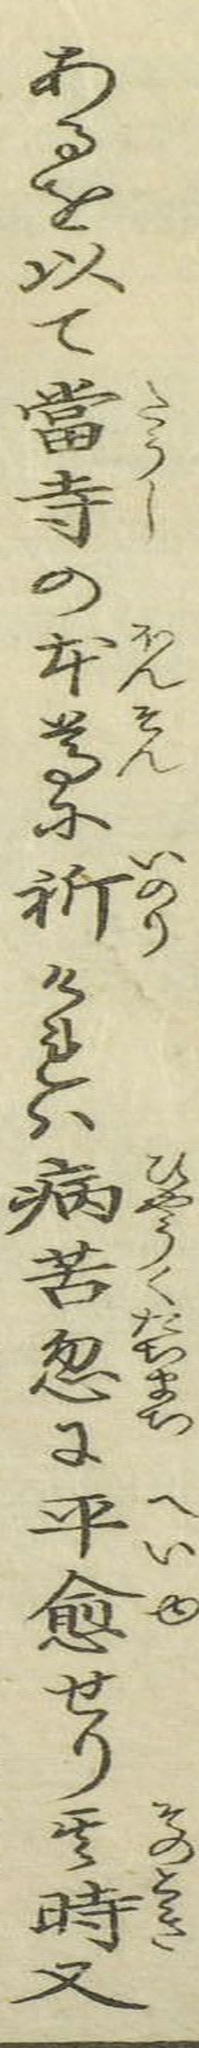あるを以て当寺の本尊に祈けれは病苦忽に平愈せり其時又
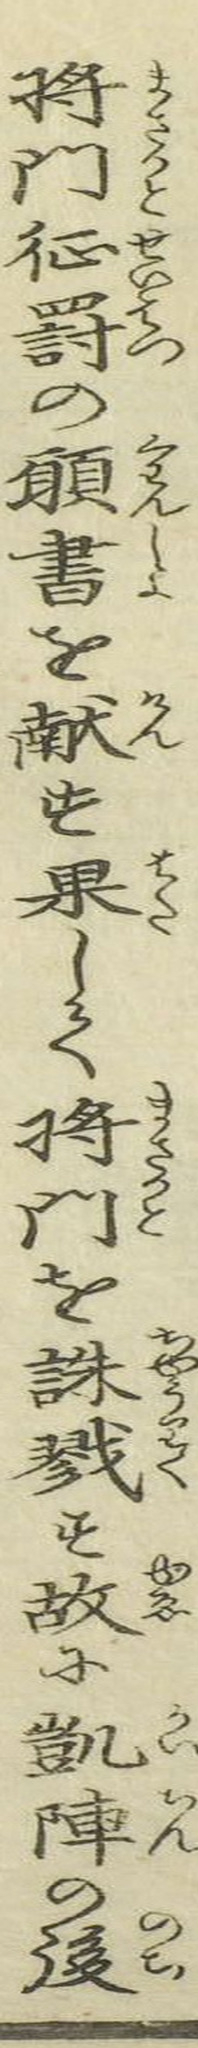将門征罰の願書を献す果して将門を誅戮す故に凱陣の後
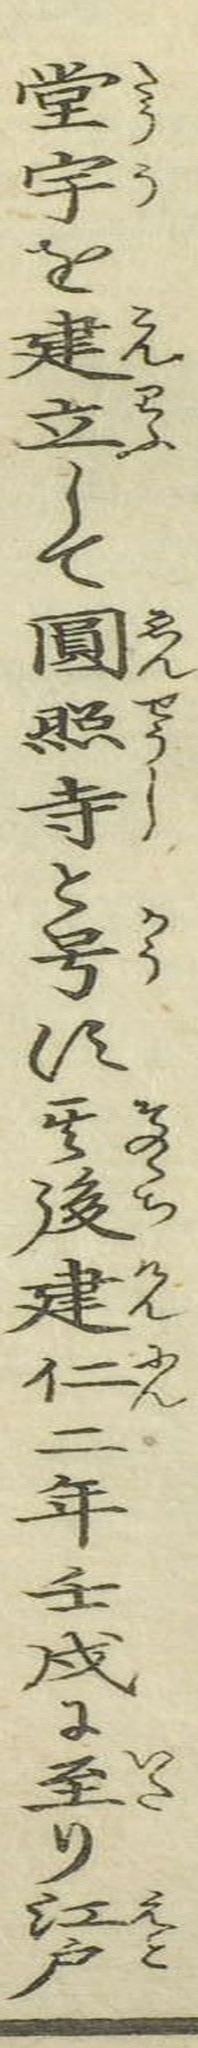堂宇を建立して円照寺と号す其後建仁二年壬戌に至り江戸
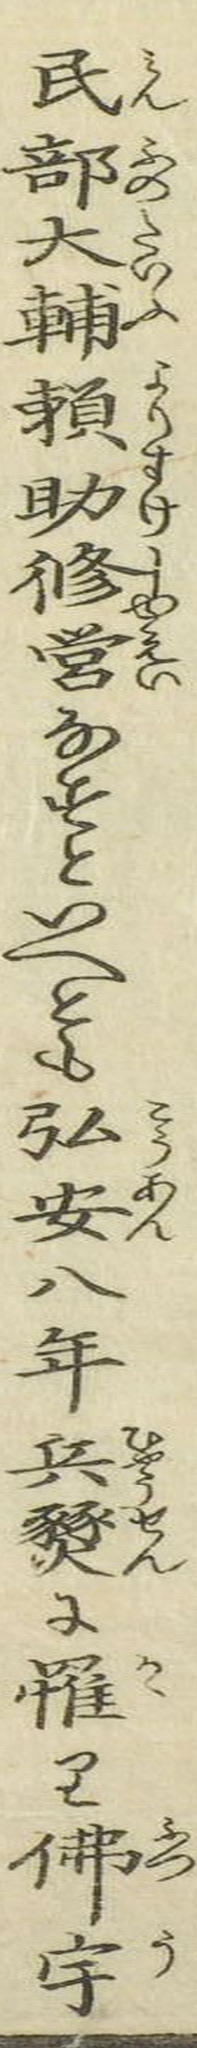民部大輔頼助修営なすといへとも弘安八年兵燹に罹り仏宇
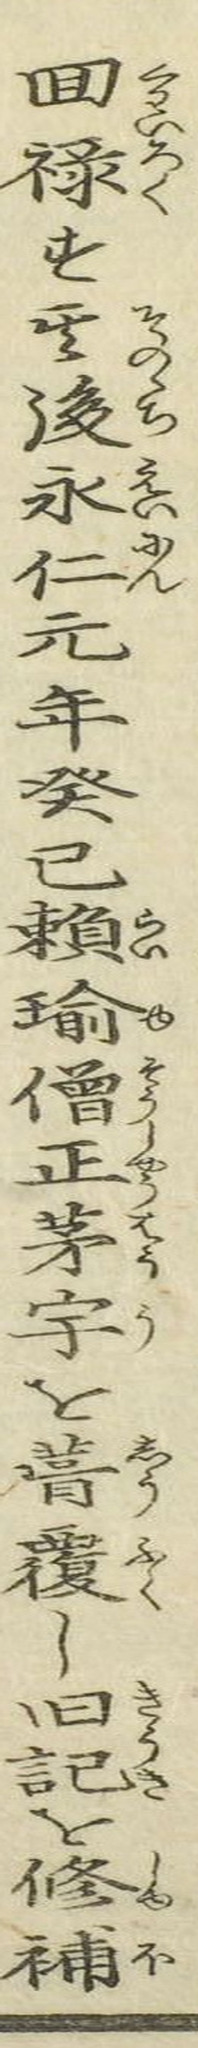回禄す其後永仁元年癸巳頼瑜僧正茅宇を葺復し旧記を修補
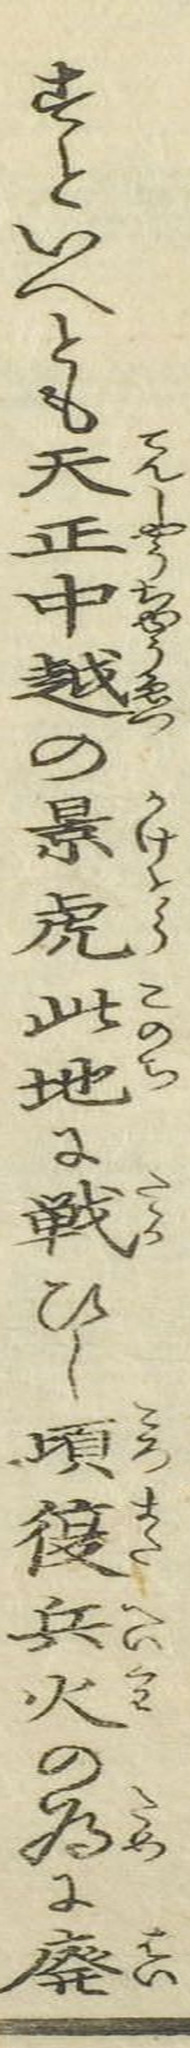すといへとも天正中越の景虎此地に戦ひし頃復兵火の為に廃
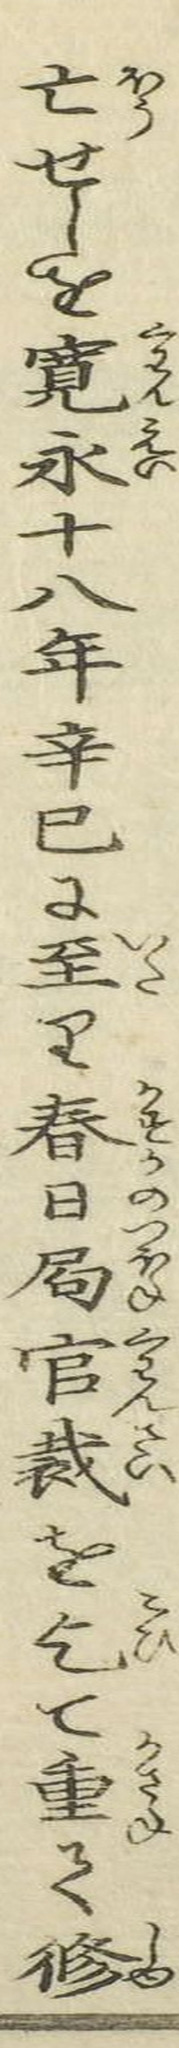亡せしを寛永十八年辛巳に至り春日局官裁を乞て重て修
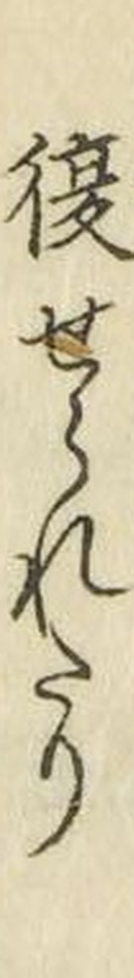復せられたり
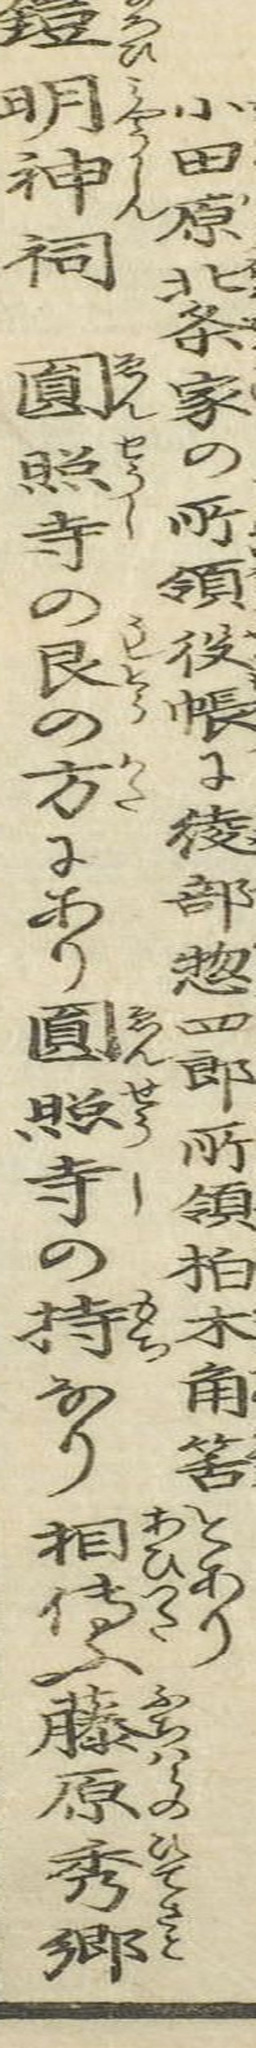鎧明神祠円照寺の艮の方にあり円照寺の持なり相伝ふ藤原秀郷
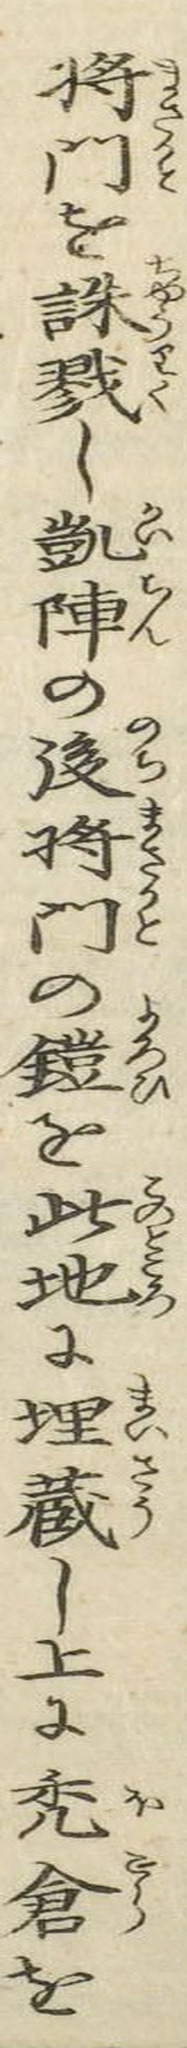将門を誅戮し凱陣の後将門の鎧を此地に埋蔵し上に禿倉を
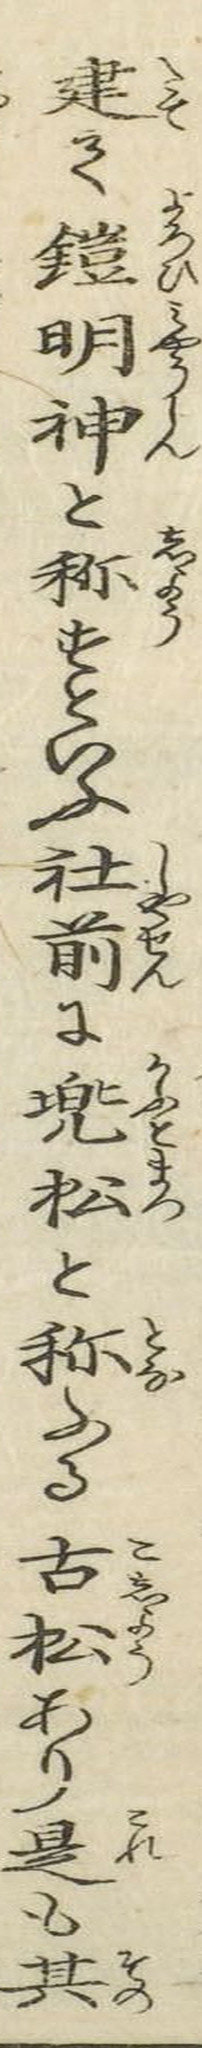建て鎧明神と称すといふ社前に兜松と称ふる古松あり是も其
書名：江戸名所図会 20巻 巻之11
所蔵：東京学芸大学教育コンテンツアーカイブ
